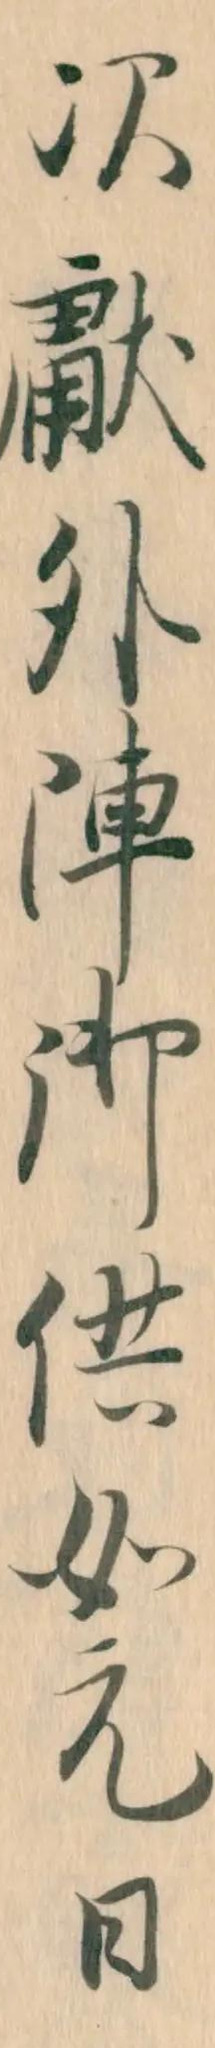次献外陣御供如元日
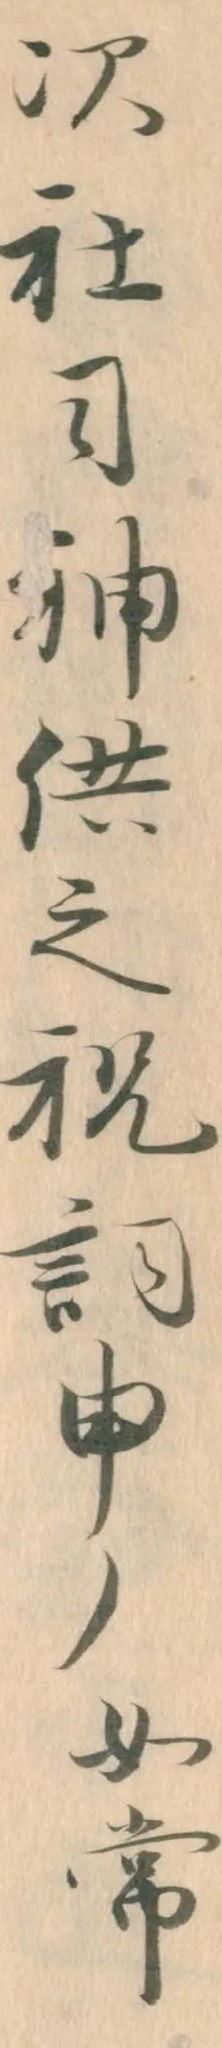次社司神供之祝詞申ノ如常
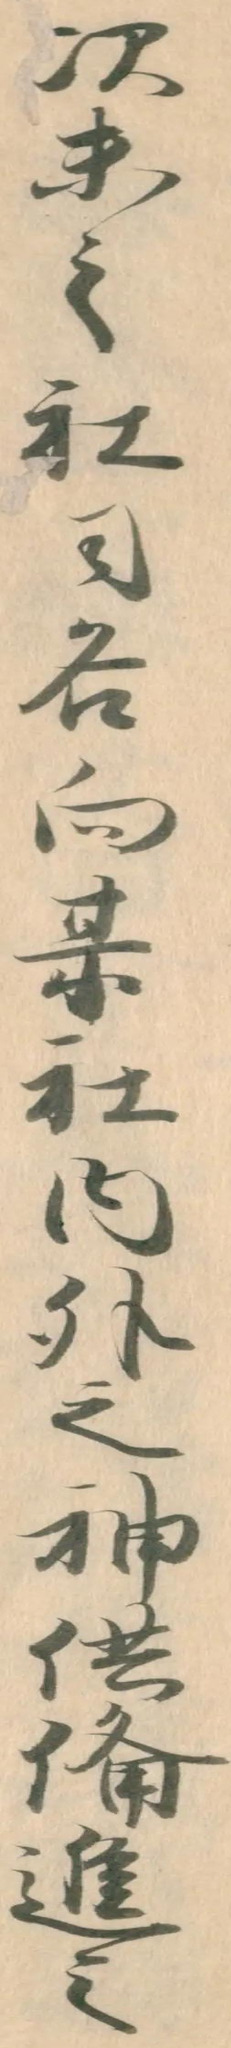次末之社司各向某社内外之神供備進之
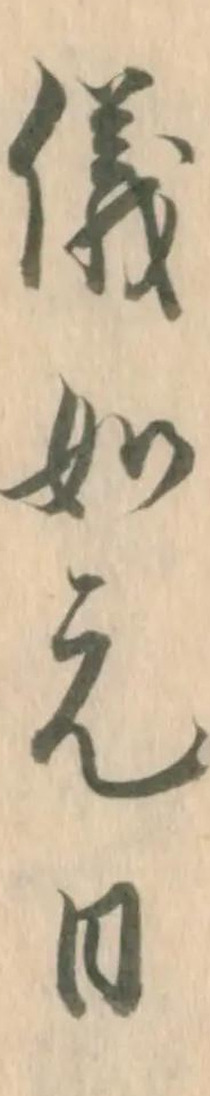儀如元日
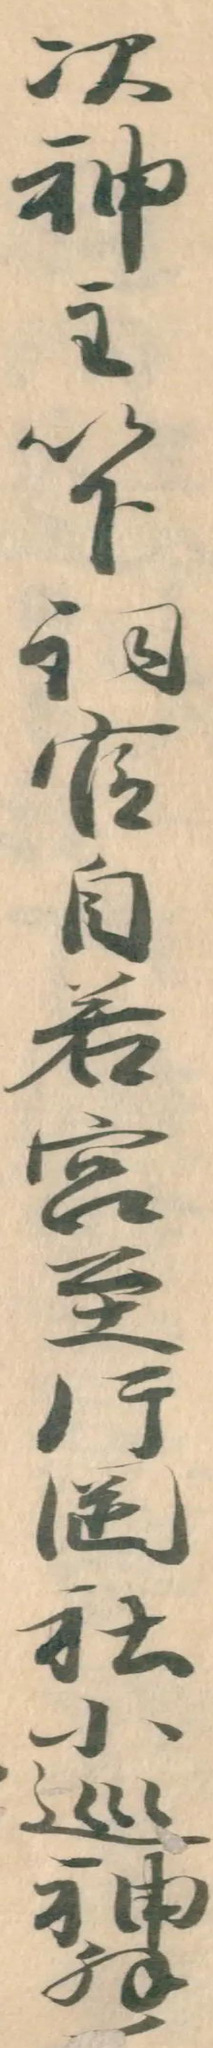次神主以下詞官自若宮至片岡社小巡神拝
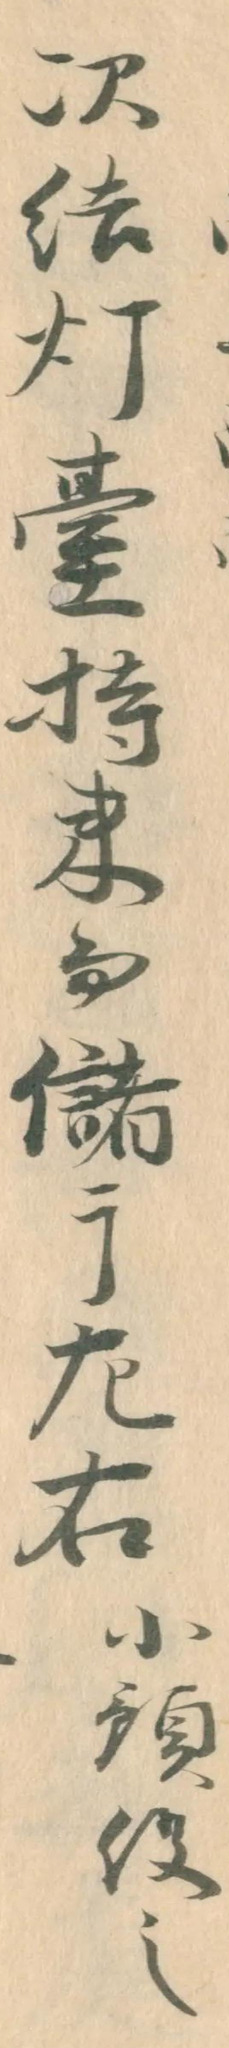次結灯台持来而儲于左右小預役之
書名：賀茂太神宮年中神事略次第
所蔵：国立国会図書館 National Diet Library, JAPAN
